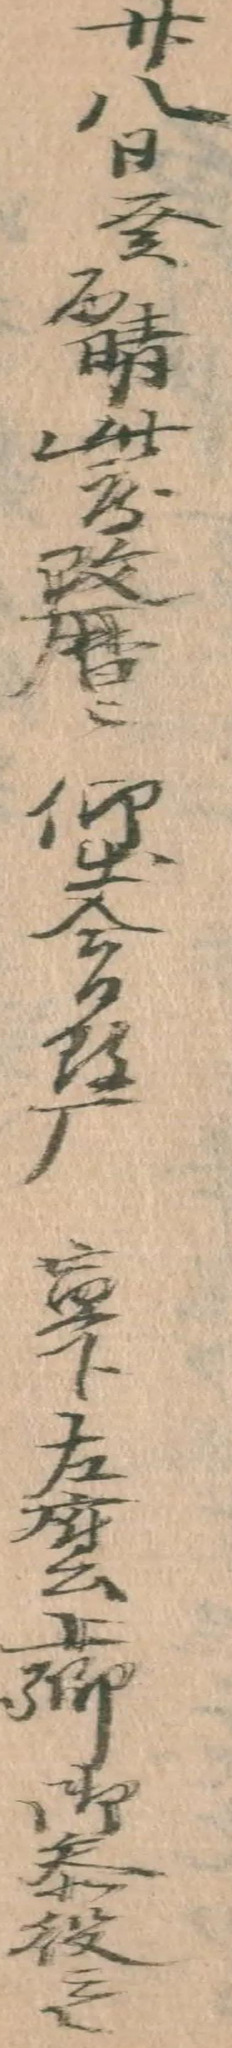廿八日癸酉此度改暦被仰出今日改暦宣下左府公上卿御参役云々
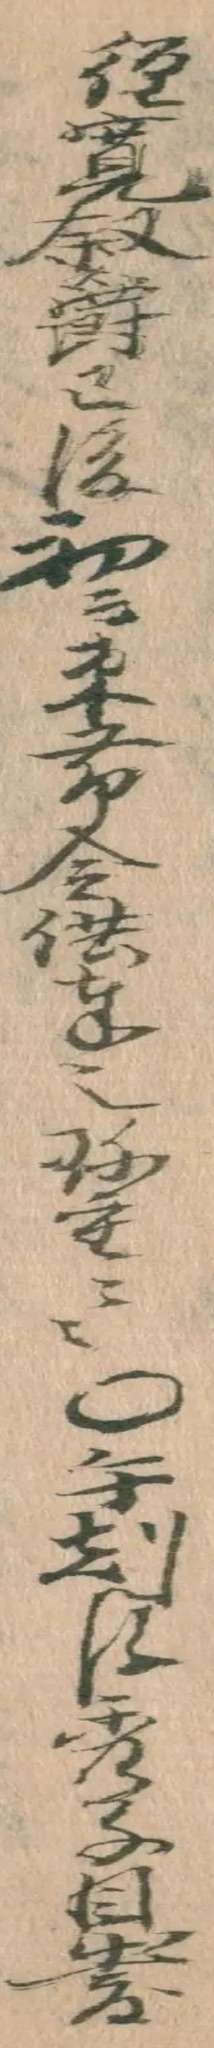経寛叙爵已後初而束帯令供奉也珍重々々〇午刻後秀子目出度
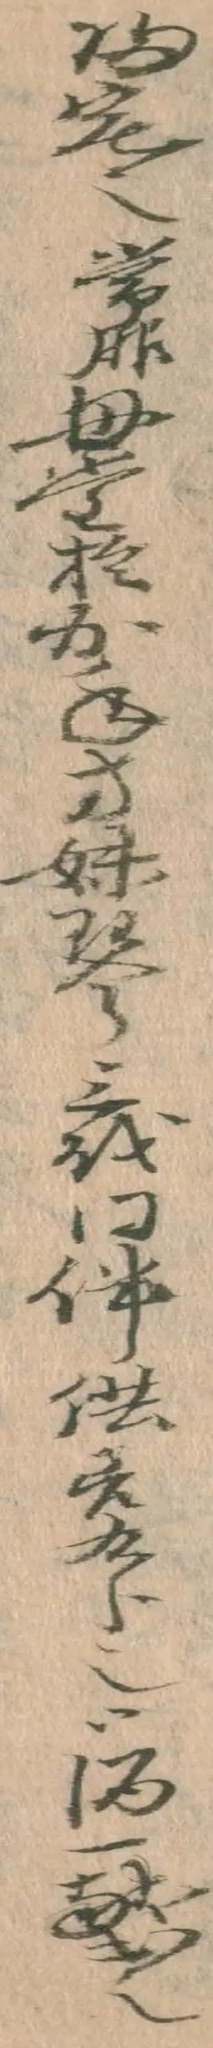帰宅也常服母堂おかね方妹琴みを同伴供善九郎也御酒一献出之
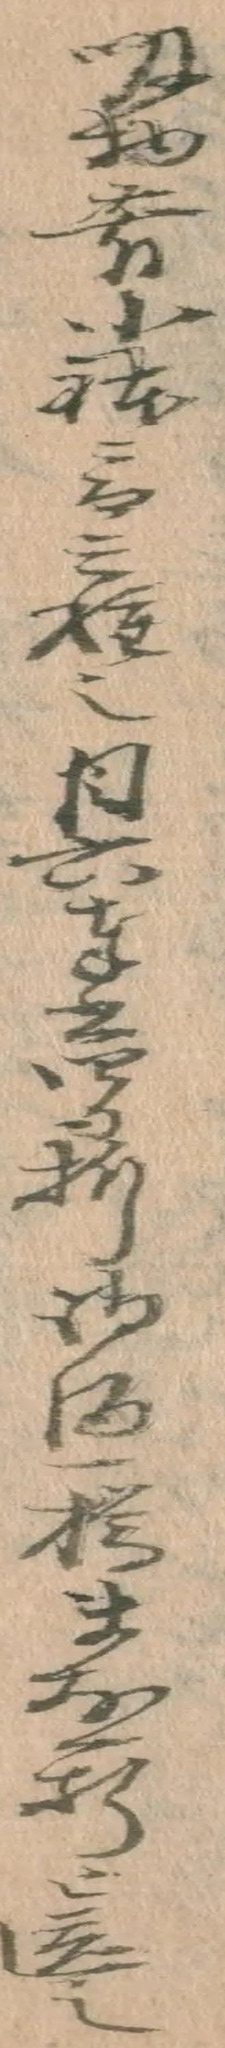吸物肴小鉢ニ而三種也目六奉書四ツ折御酒一樽まな一折被送也
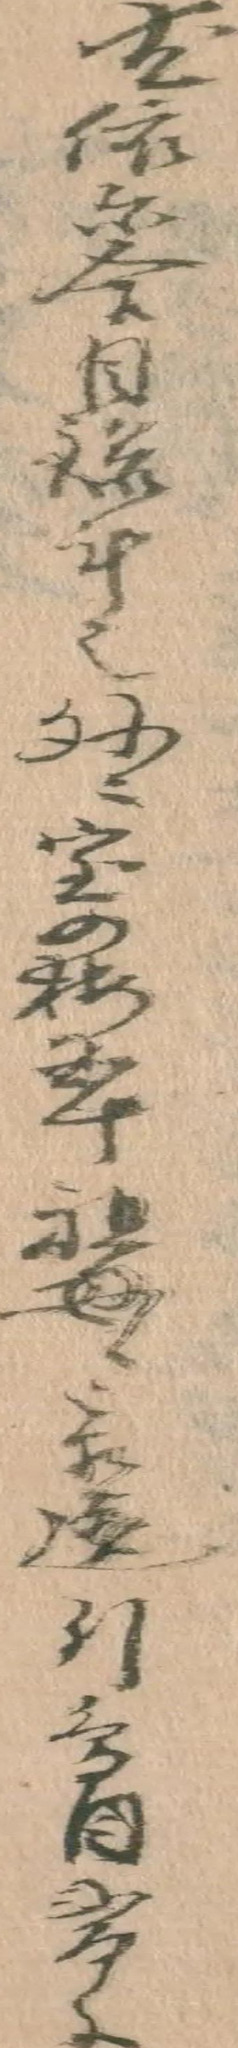尤依尓合目録斗之外ニ宝の梅五十祖母へ被相送引鳥目弐百文
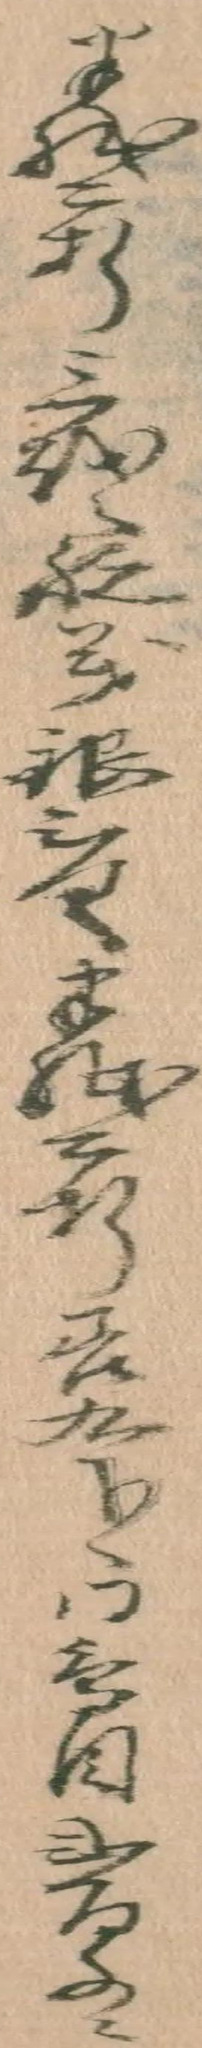半紙二折三越之祝義銀三匁半紙二折善九郎へ同鳥目弐百文ニ
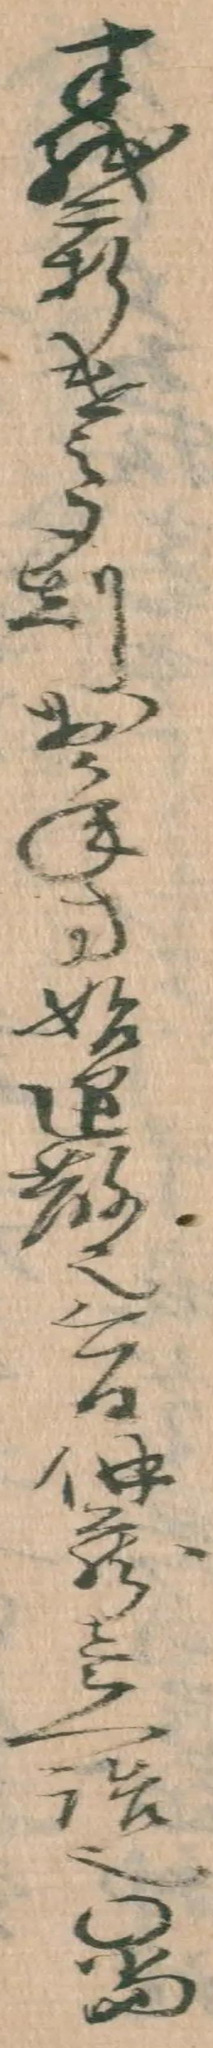半紙二折遣之夕刻おかね方始退散也今日仲蔵壱人詰也○當
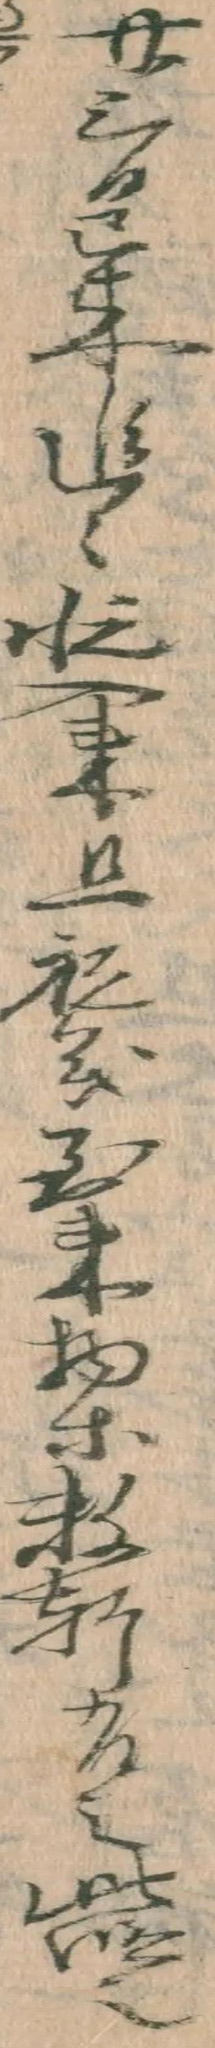廿三日已来追々祝入来且祝義到来物等数軒有之此段之
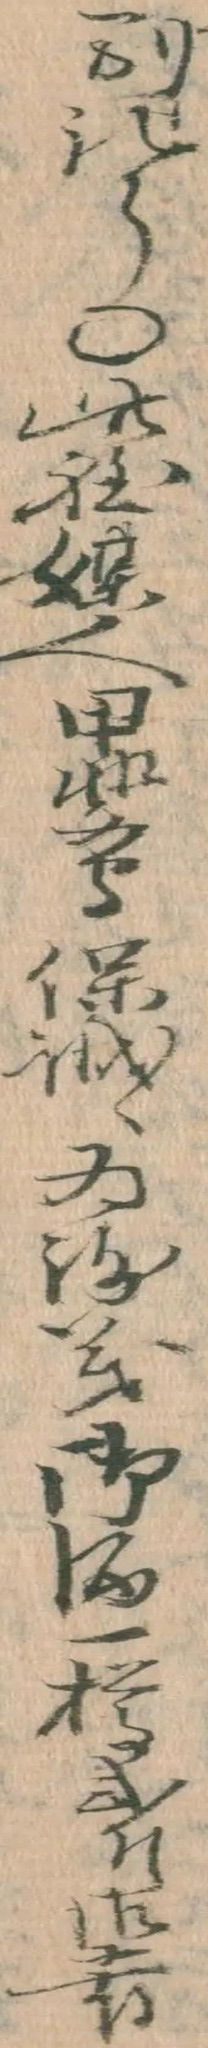ニ別記了〇此程媒人甲斐守保誠へ為縁義御酒一樽二升御肴
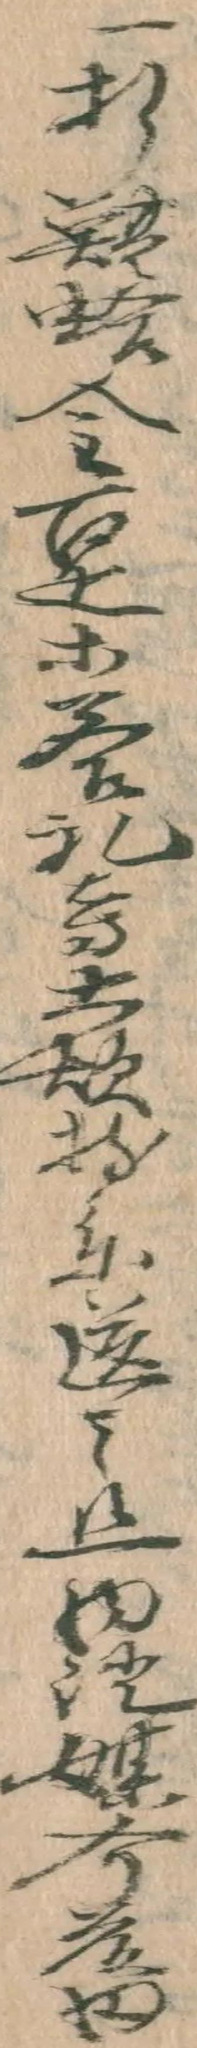一折鯵蛤金百疋等答礼旨大炊持参送之且内證媒介藤田
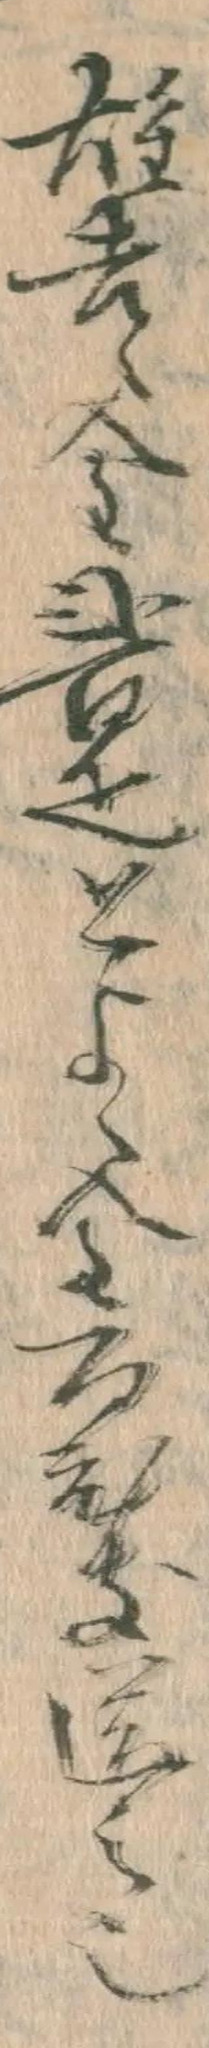雄吉ヘ金弐百疋とよゝ金百弐文送之也
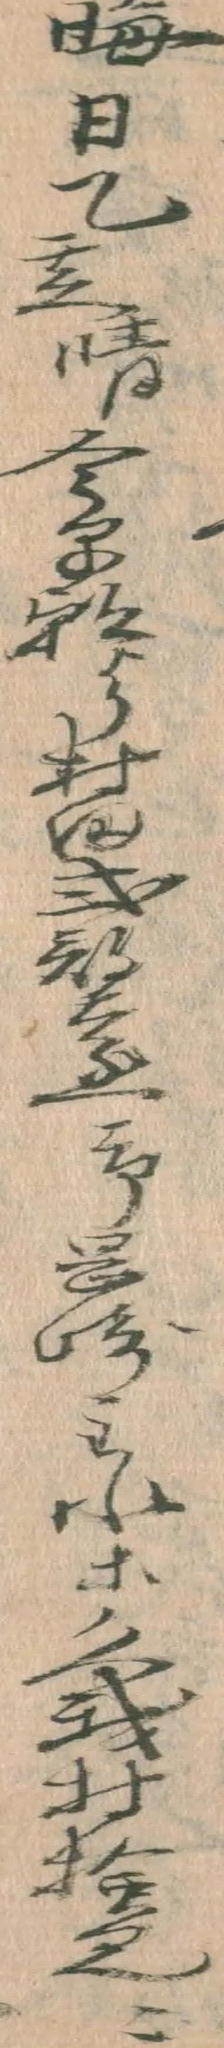晦日乙亥晴今早朝より村田式部大丞予岡崎主水等久我村検見ニ
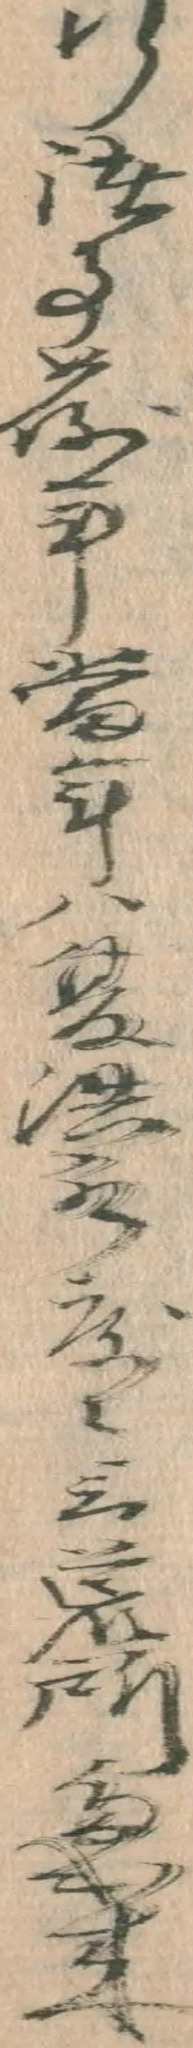行諸事如例年當年ハ夏洪水度々ニ而荒所多出来
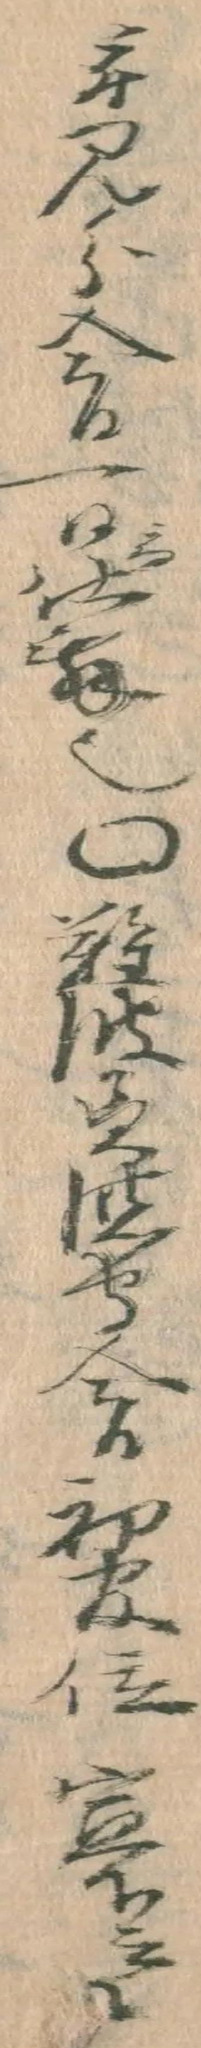ニ付見分今日一日ニ而仕舞也○難波美濃守今日初官位宣下云々
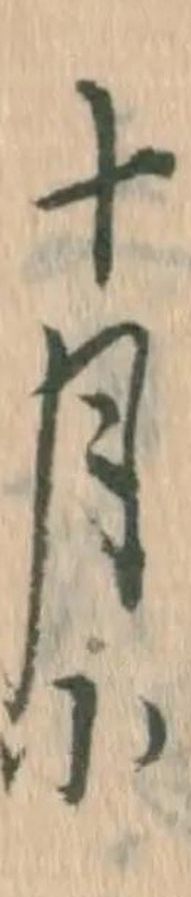十月小
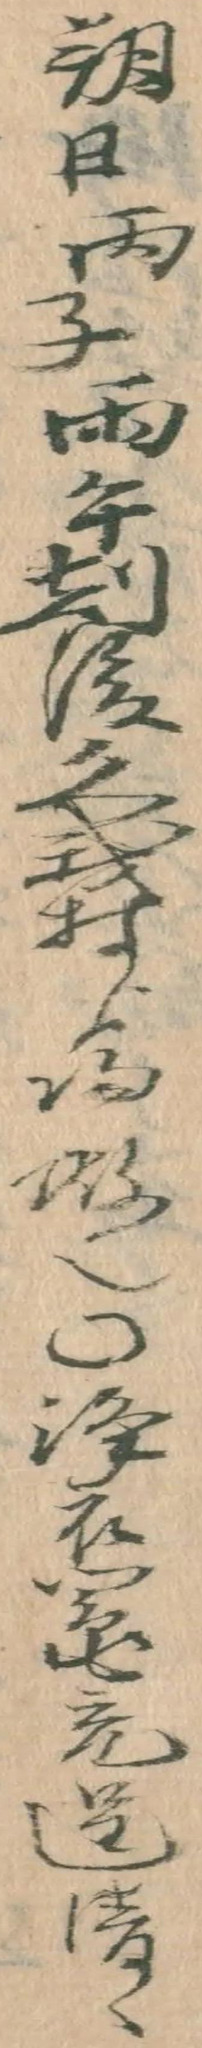朔日丙子雨午刻後久我村ゟ帰殿也○浄衣鬮充逞清へ
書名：賀茂社記録. 第69冊
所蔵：国立国会図書館 National Diet Library, JAPAN
